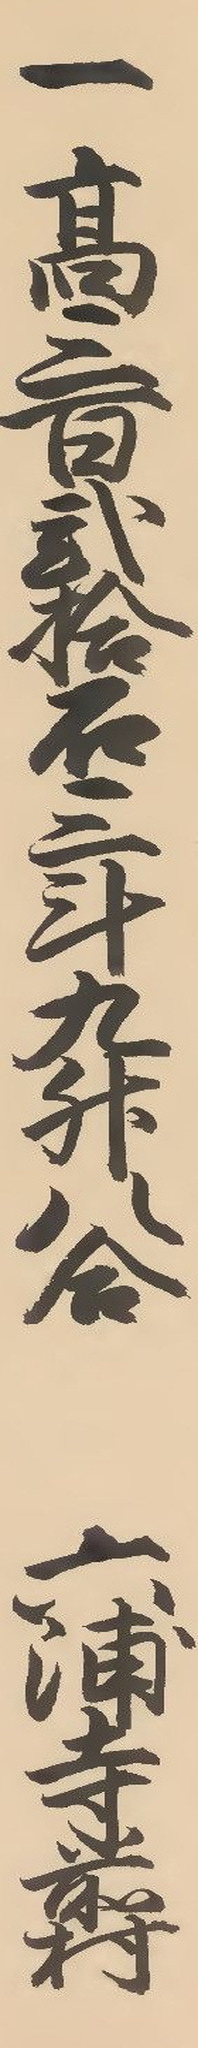一高三百弐拾石三斗九升八合六浦寺前村
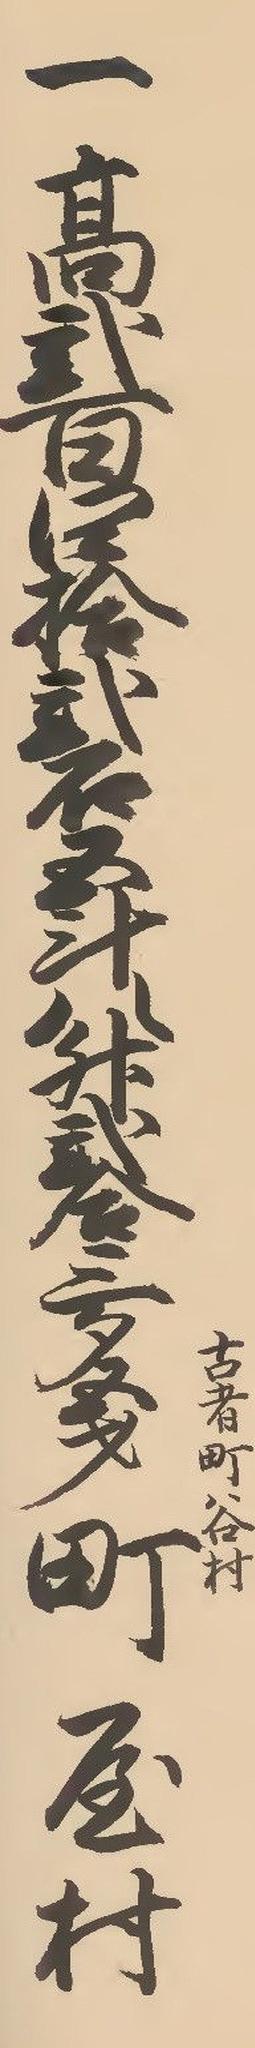一高弐百四拾弐石五斗八升弐合三勺五才町屋村
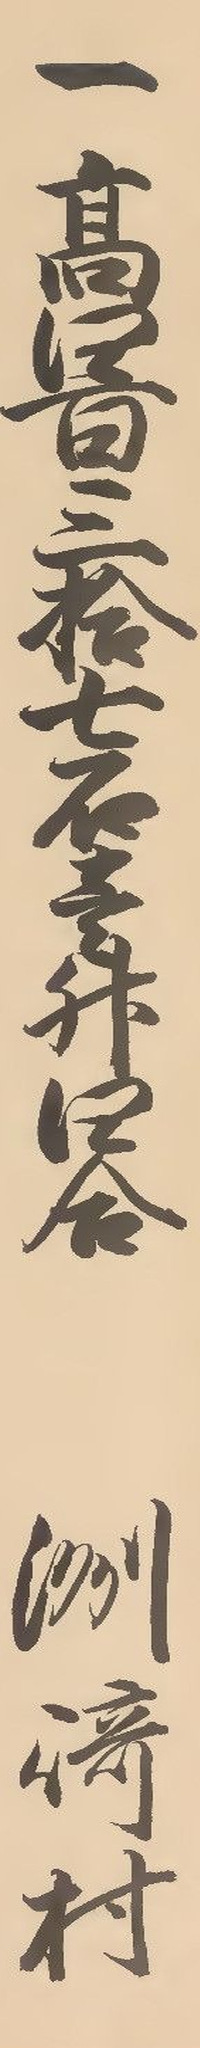一高四百三拾七石壱升四合洲崎村
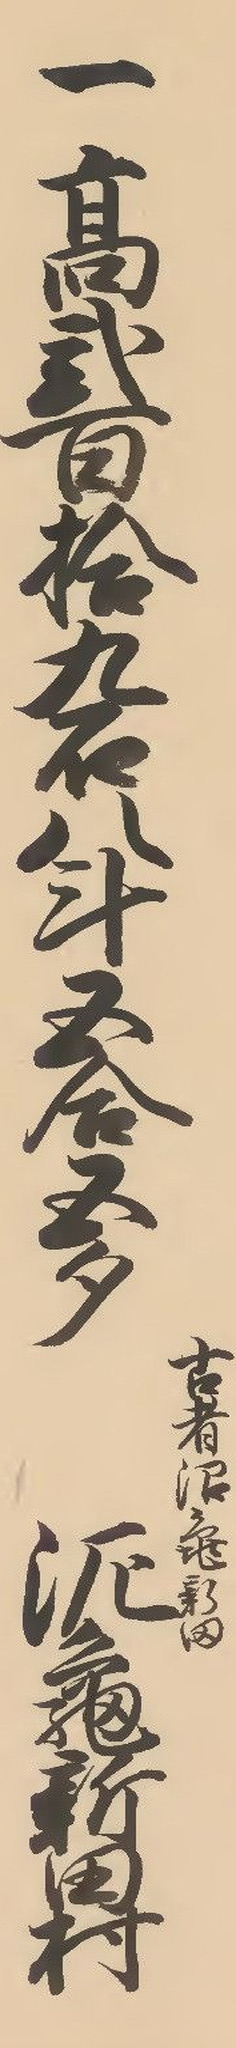一高弐百拾九石八斗五合五勺泥亀新田村
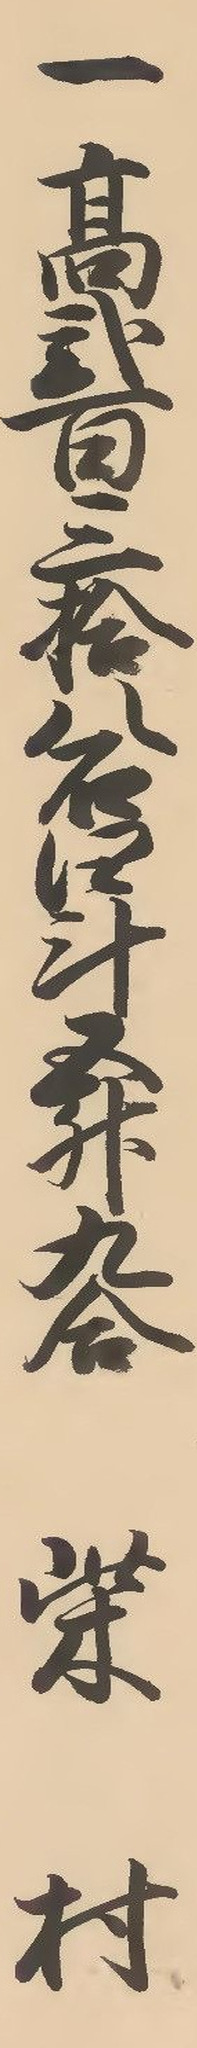一高弐百三拾八石四斗五升九合柴村
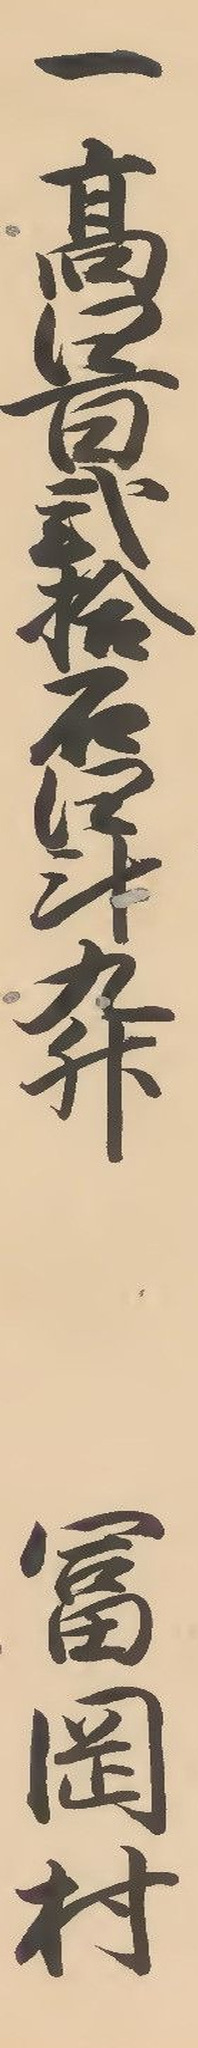一高四百弐拾石四斗九升冨岡村

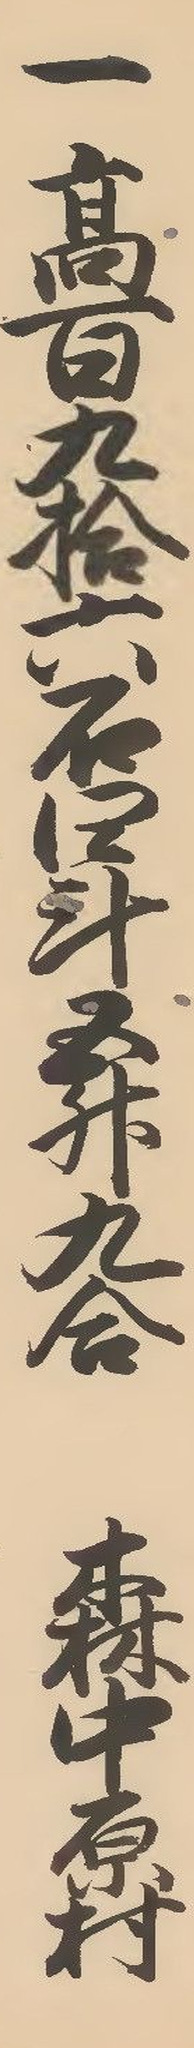一高百九拾六石四斗五升九合森中原村
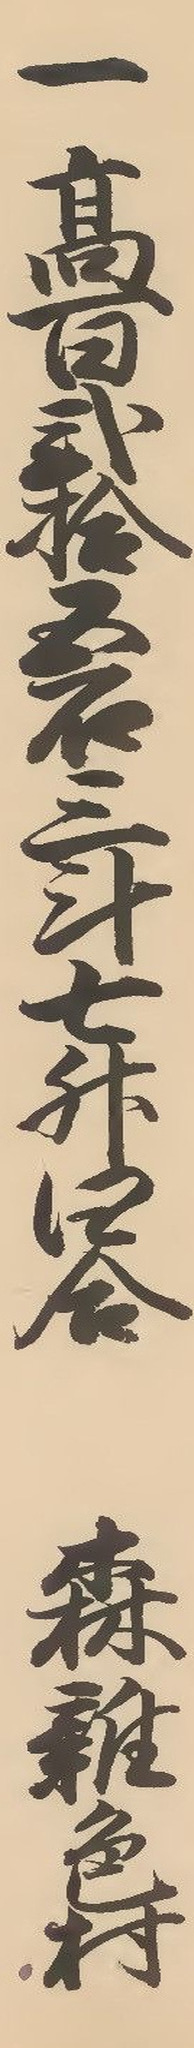一高百弐拾五石三斗七升四合森雑色村
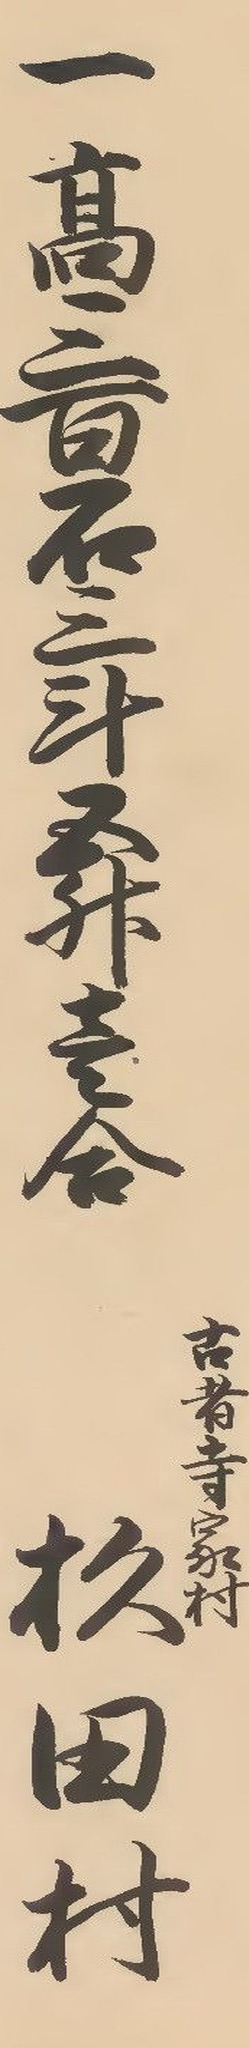一高三百石三斗五升壱合杉田村
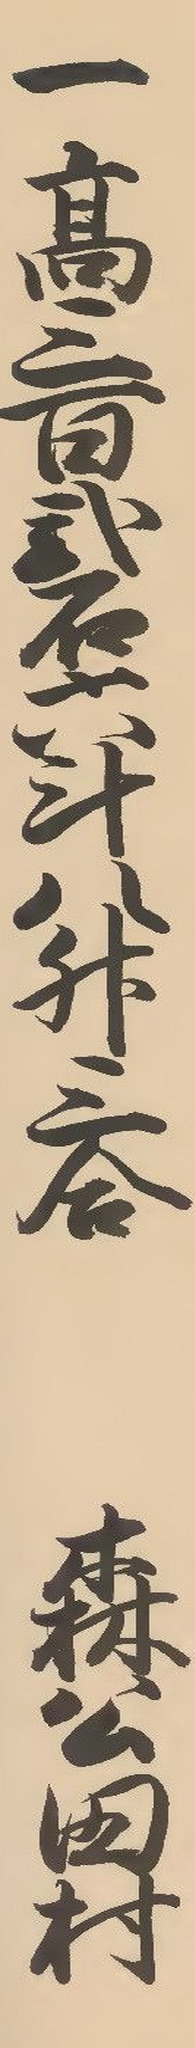一高三百弐石六斗八升三合森公田村
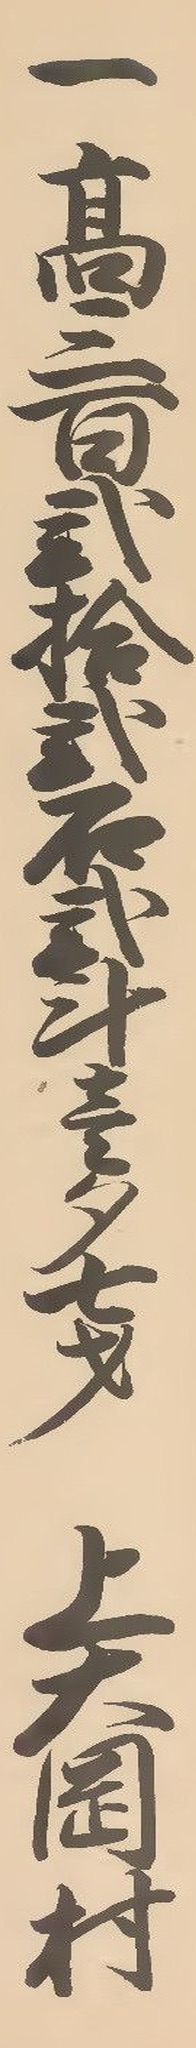一高三百弐拾弐石弐斗壱勺七才上大岡村
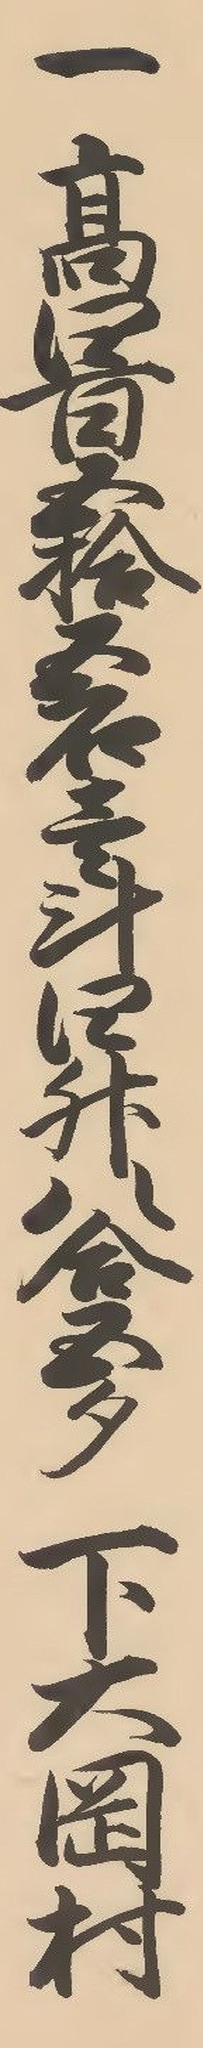一高四百五拾五石壱斗四升八合五勺下大岡村
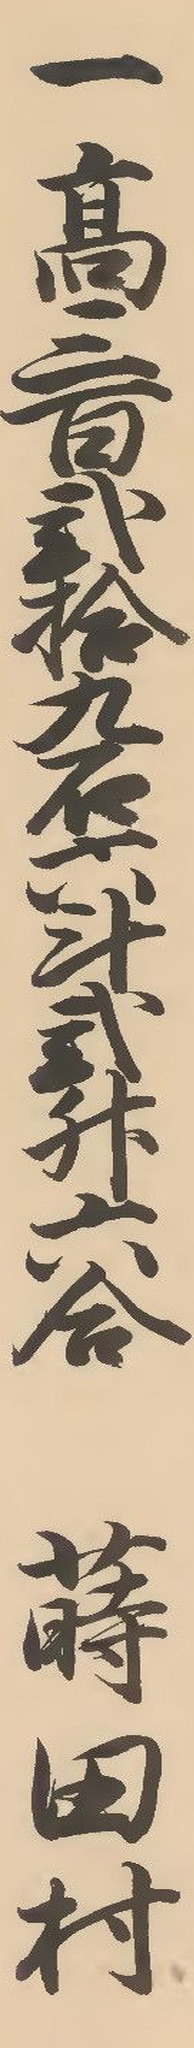一高三百弐拾九石六斗弐升六合蒔田村
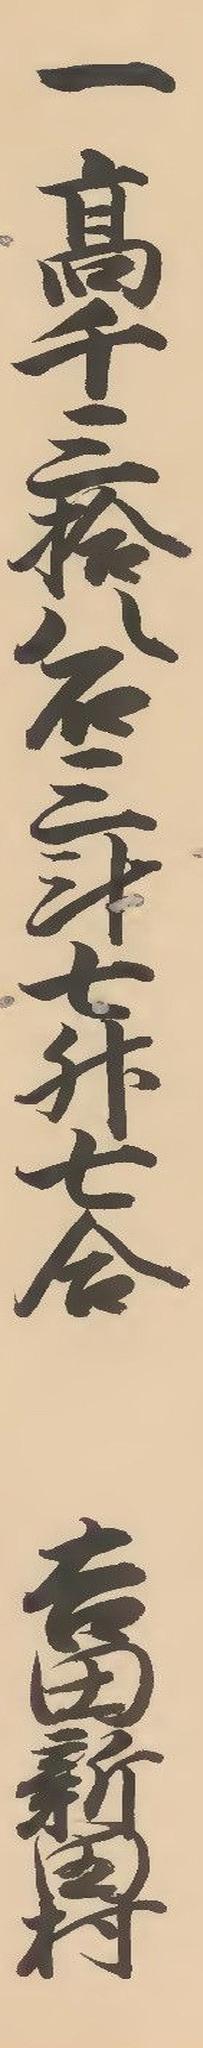一高千三拾八石三斗七升七合吉田新田村

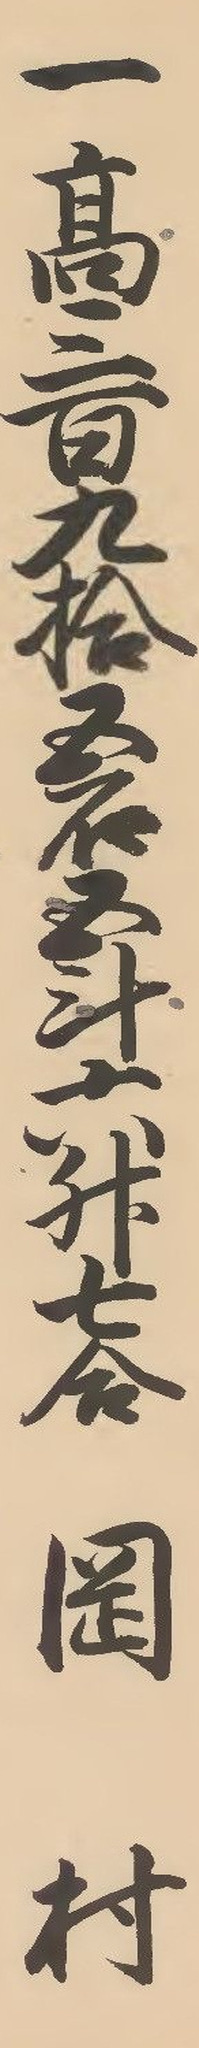一高三百九拾五石五斗六升七合岡村
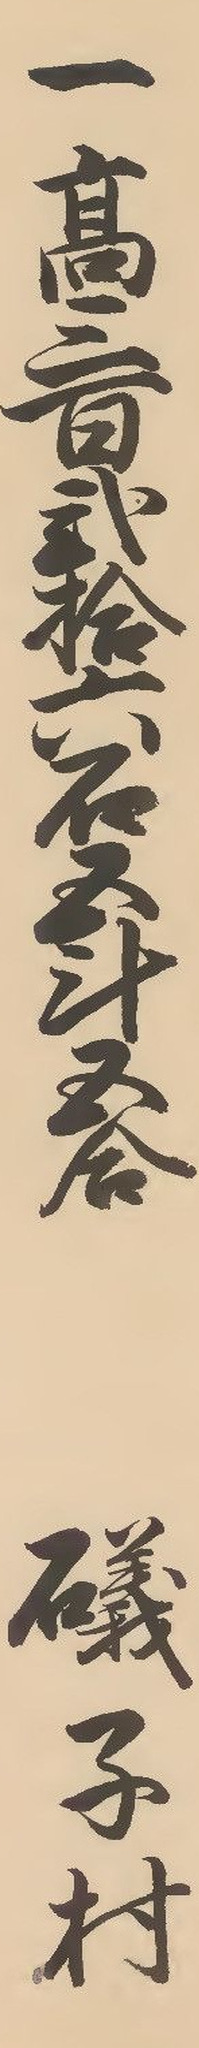一高三百弐拾六石五斗五合礒子村
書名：武蔵国郷帳　上
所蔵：国立公文書館 National Archives of Japan
